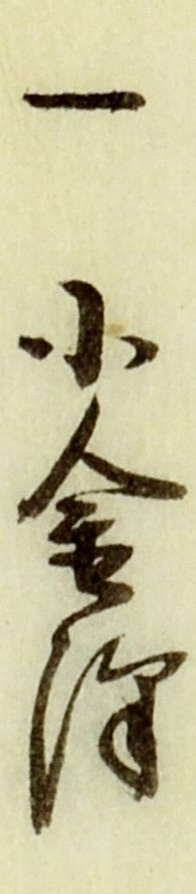一小金沢
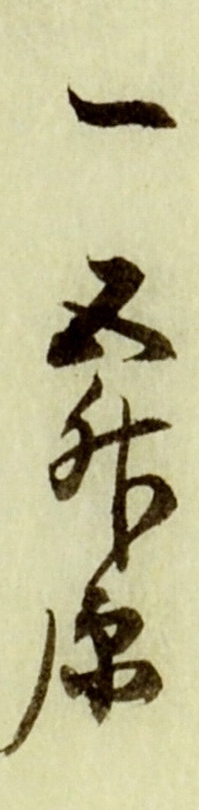一五升原
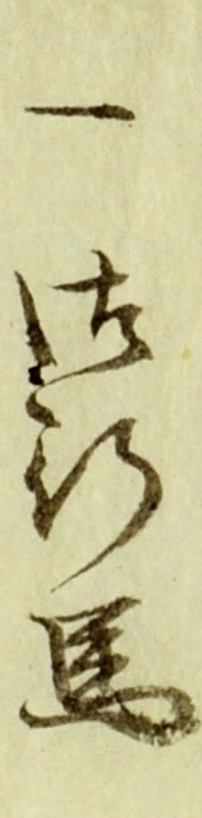一御行馬
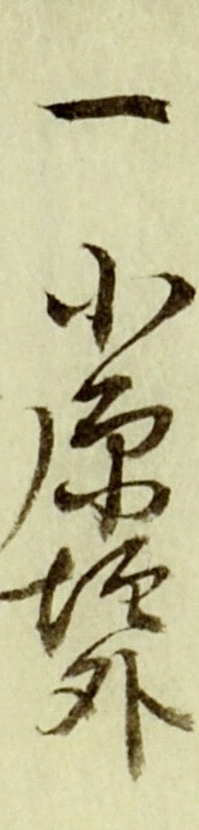一小原垣外
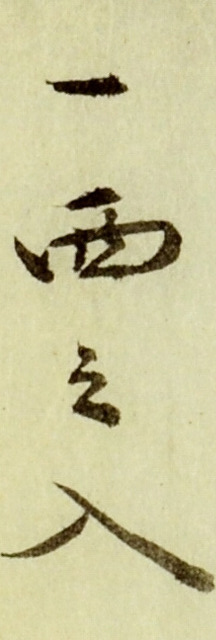一西之入
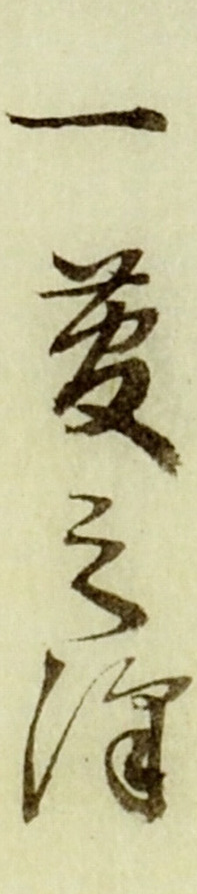一菱之沢

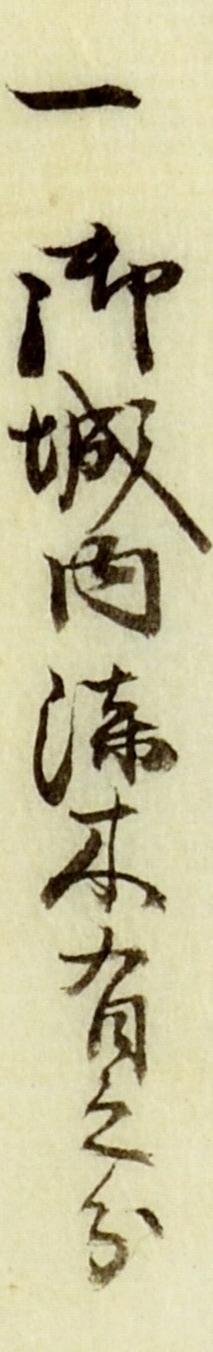一御城内漆木有之分
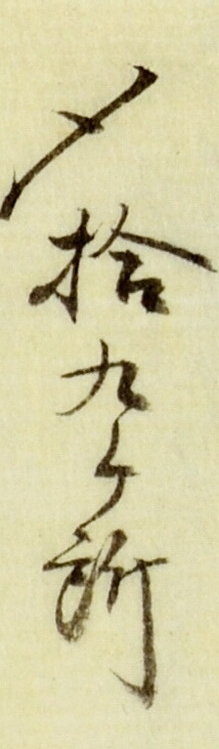〆拾九ヶ所
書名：漆桑畑控
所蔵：伊那市立高遠町図書館・合同会社AMANE
